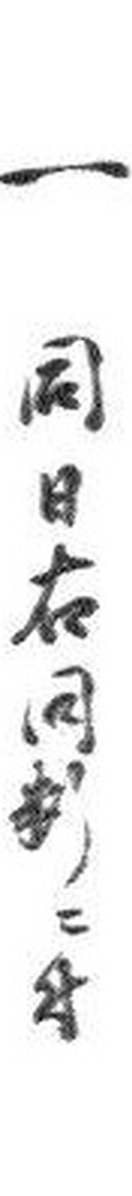一同日右同断ニ付
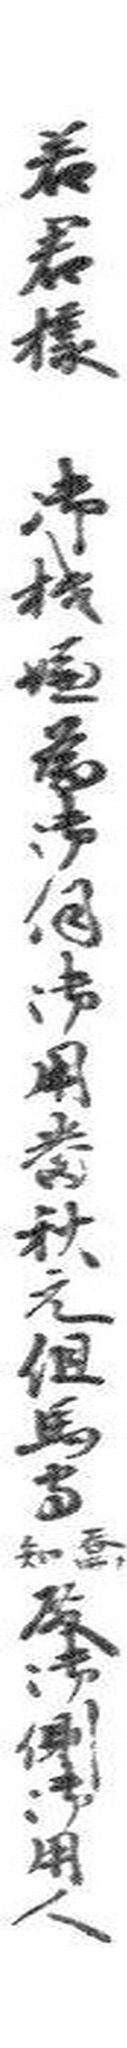若君様御機嫌為御伺御用番秋元但馬守喬知殿御側御用人
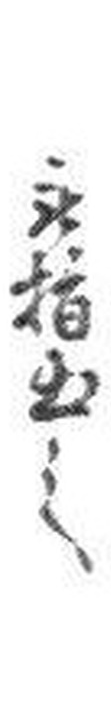被指出之
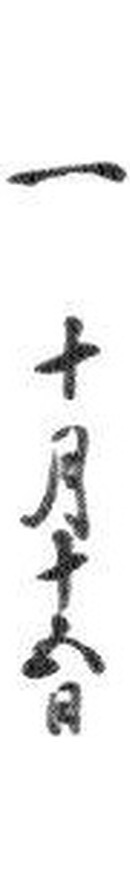一十月十五日
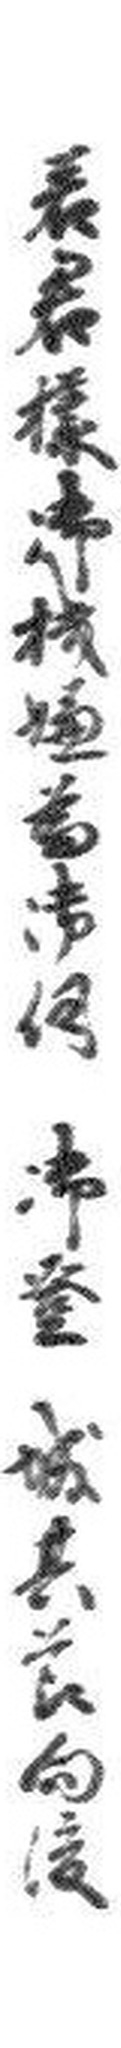若君様御機嫌為御伺御登城其節向後
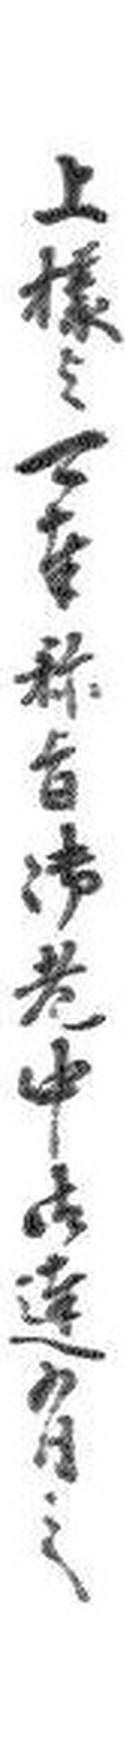上様与可奉称旨御老中御達有之
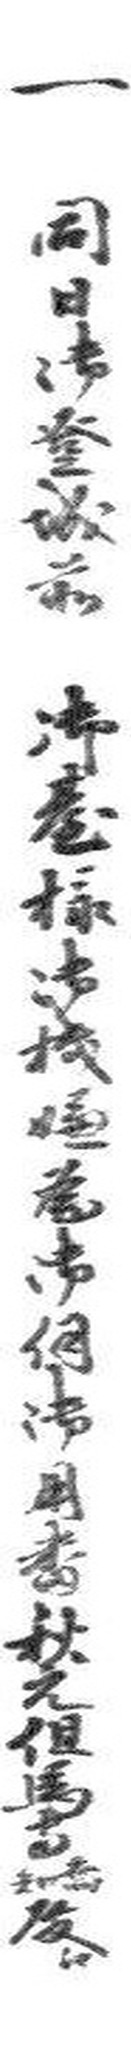一同日御登城前御台様御機嫌為御伺御用番秋元但馬守喬知殿江
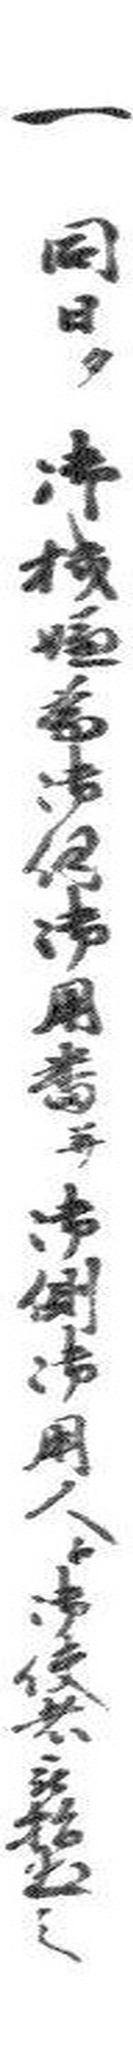一同日夕御機嫌為御伺御用番并御側御用人江御使者被指出之
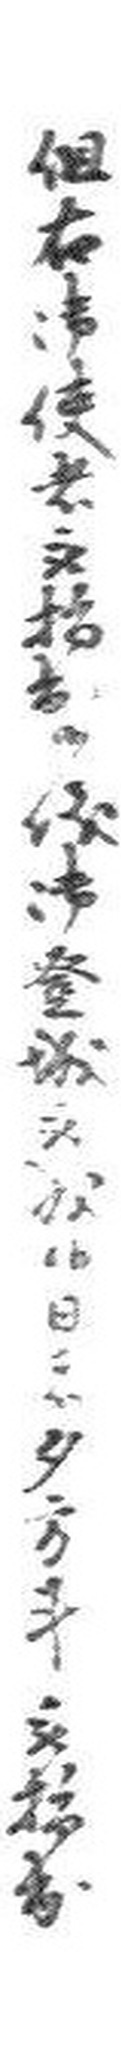但御使者被指出候儀御登城被成候日ニハ夕方斗被指出

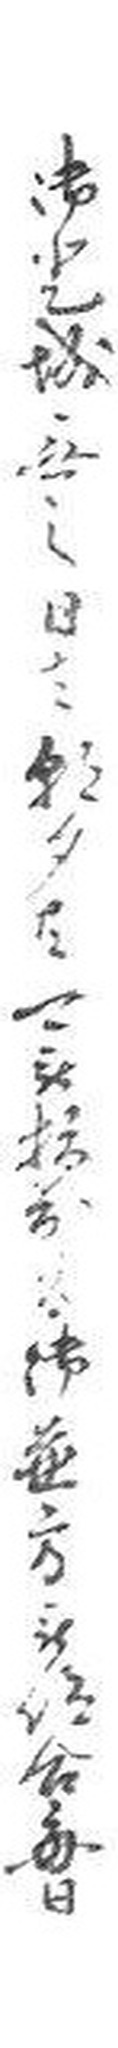御登城無之日者朝夕共可被指出旨御並方被仰合毎日
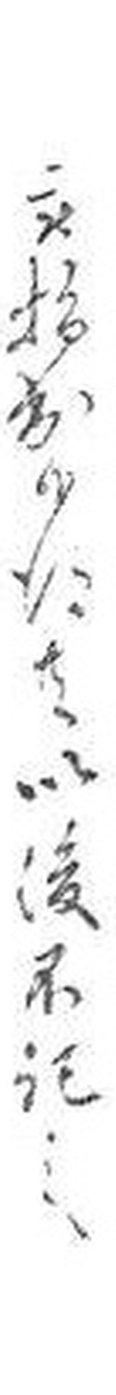被指出候得共以後不記之
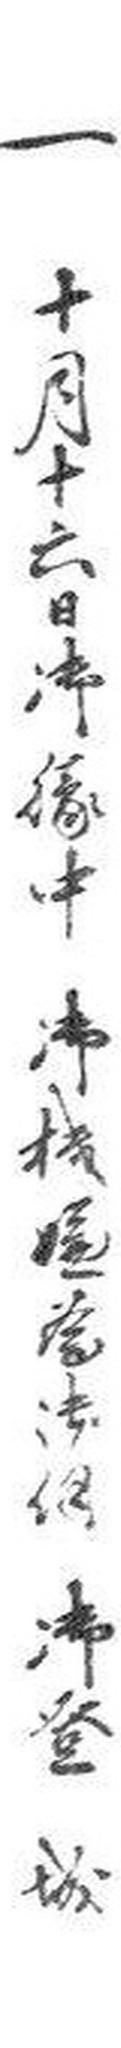一十月十六日御朦中御機嫌為御伺御登城
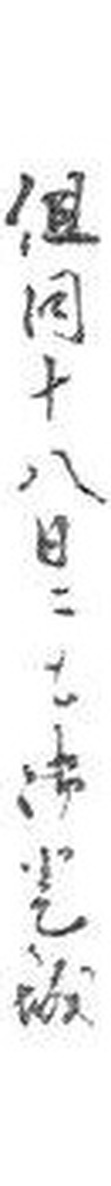但同十八日ニも御登城
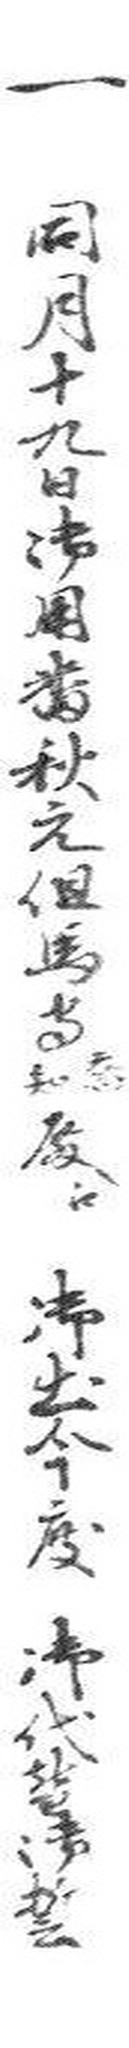一同月十九日御用番秋元但馬守喬知殿江御出今度御代替御誓
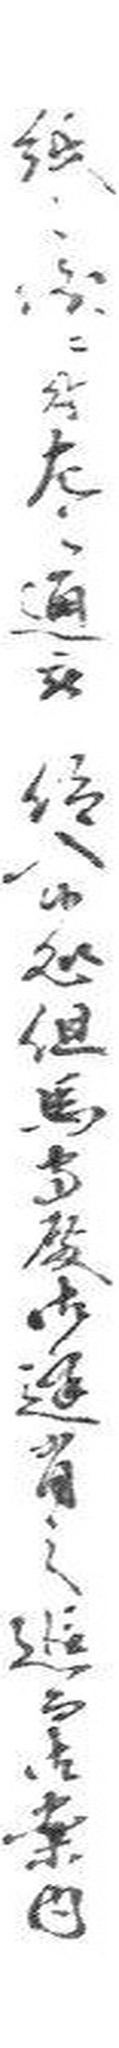紙之儀ニ付左之通被仰入候処但馬守殿御逢有之追而御案内
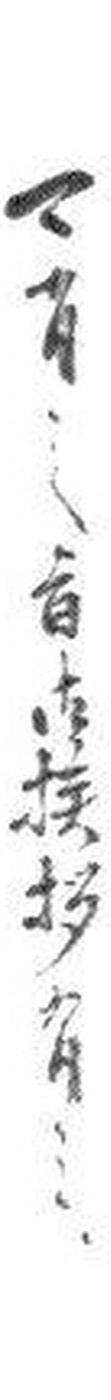可有之旨御挨拶有之
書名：家譜 二十九 吉邦公 従正徳二年到正徳三年
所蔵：福井県文書館 Fukui Prefectural Archives
